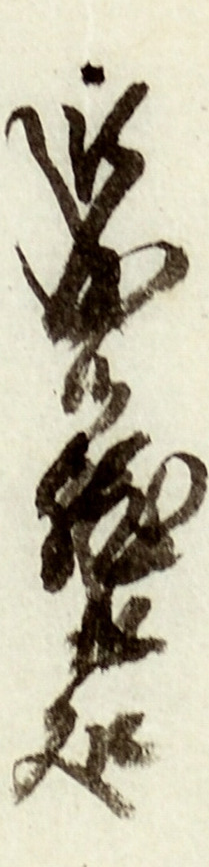被成候然る処
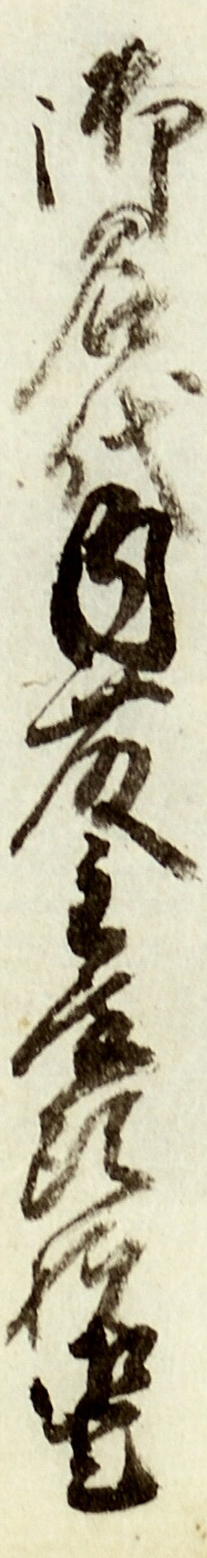御名代内藤主殿頭様御登
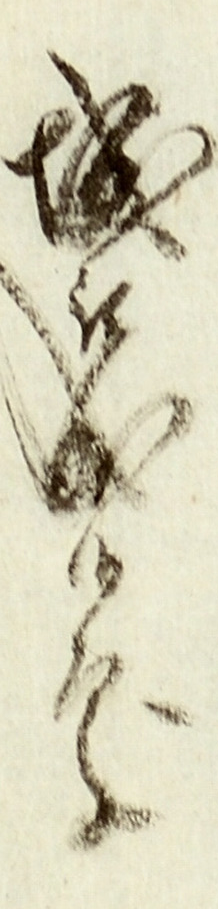城被成候処
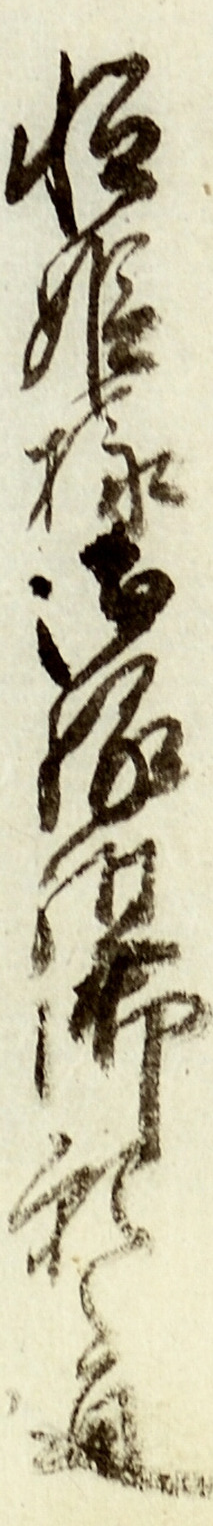恒姫様御縁組御願之通
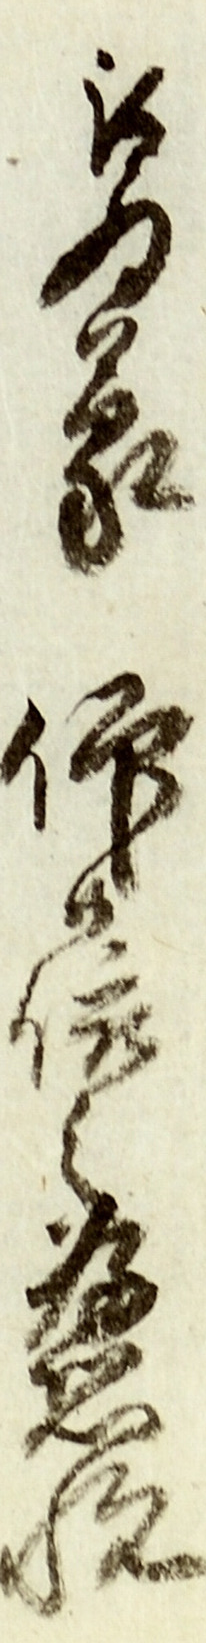被為蒙仰候依之為恐悦
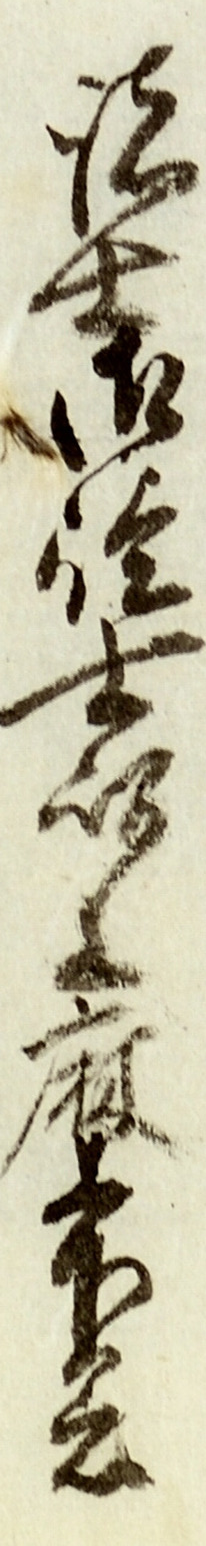諸士御徒士以上麻上下着
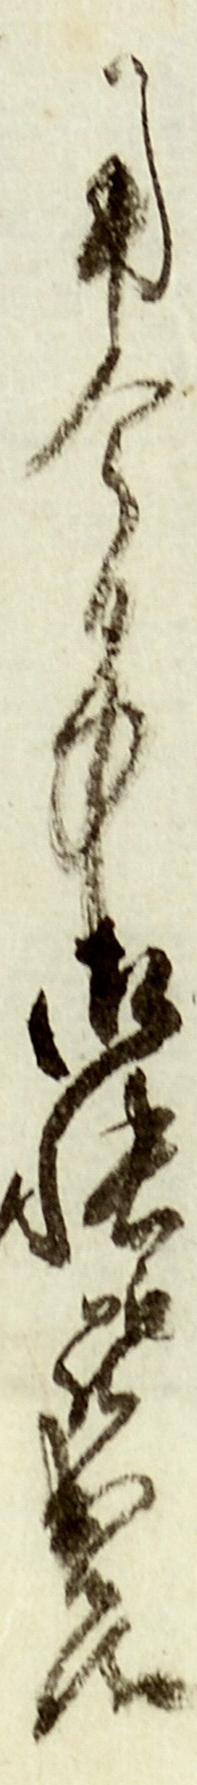用今日中御帳え罷出候様
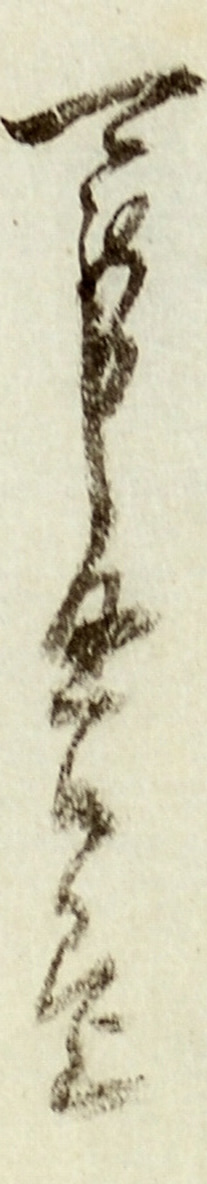可被申通候已上
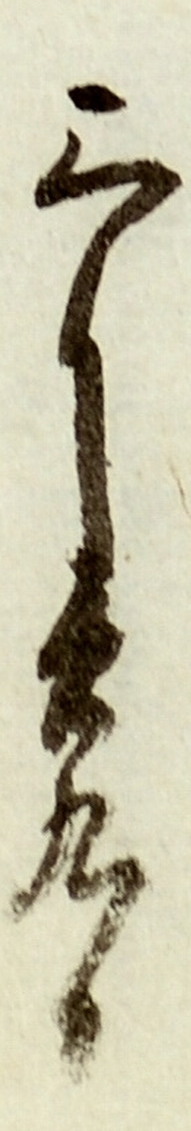三月廿九日
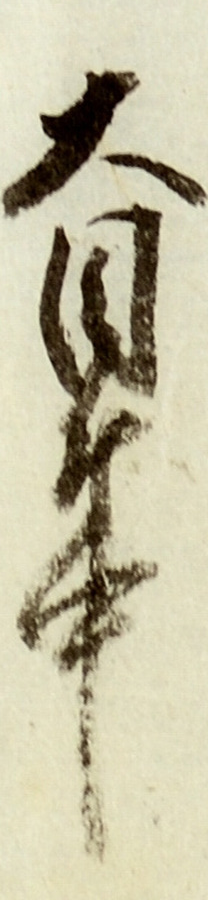大目付中
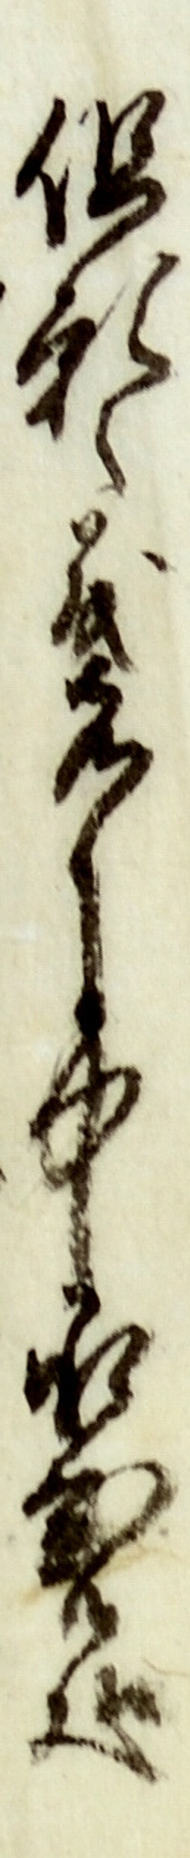但願之義先月中承知候処
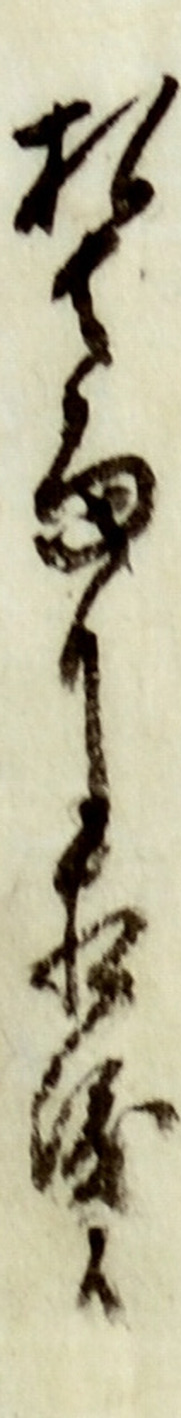札は当月相渡候

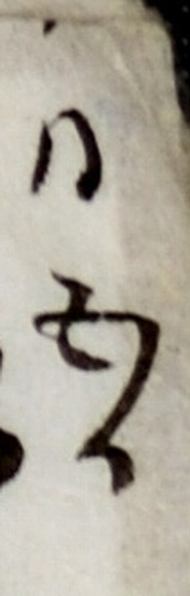同五日
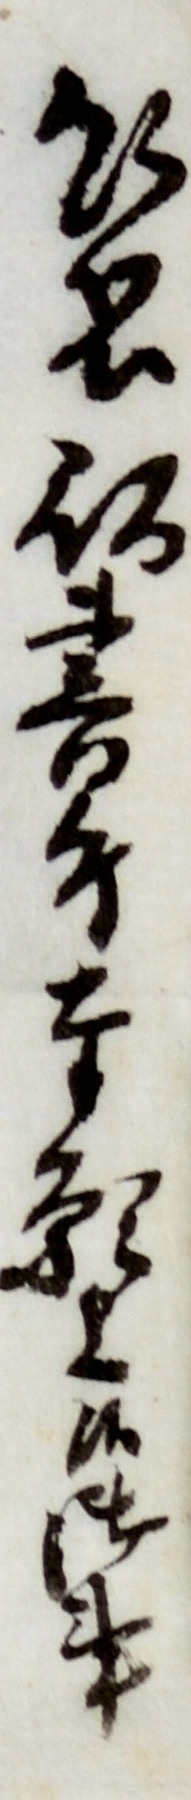乍恐以書付奉願上候御事
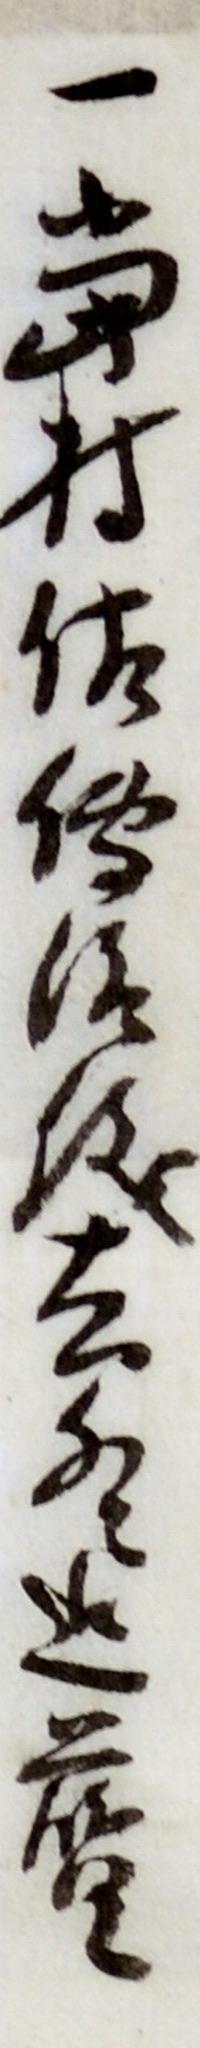一当村佐伝治儀去冬迄藍
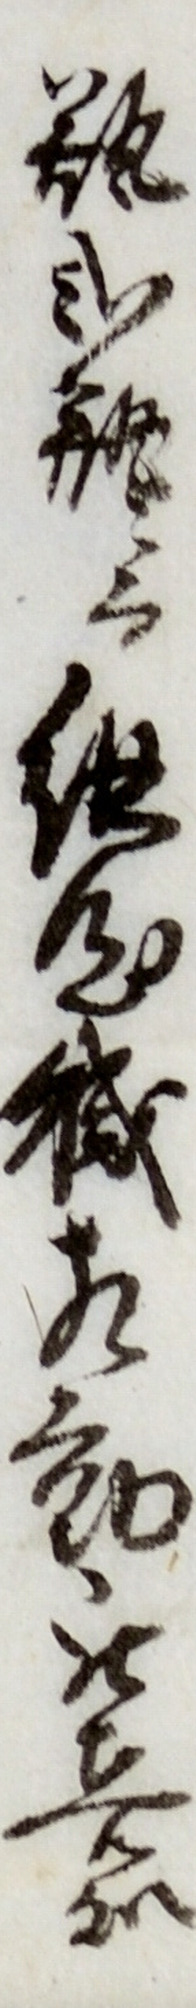瓶弐瓶にて紺屋職相勤罷在候処
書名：諸事御用留帳
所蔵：伊那市立高遠町図書館・合同会社AMANE
